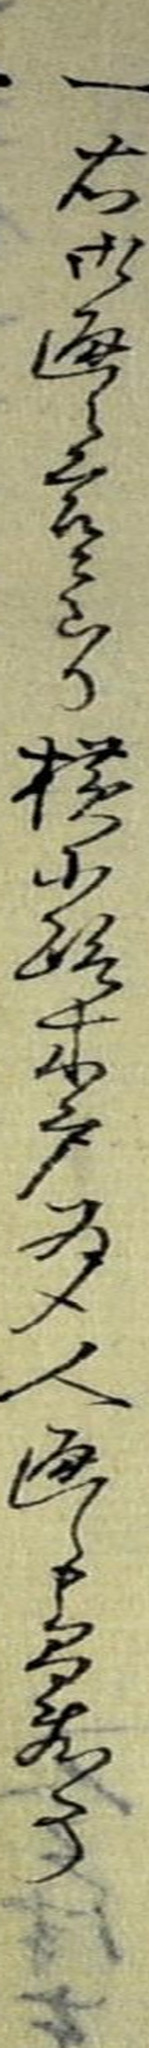一右御通之節に至り横小路木戸為〆人通し申間敷事
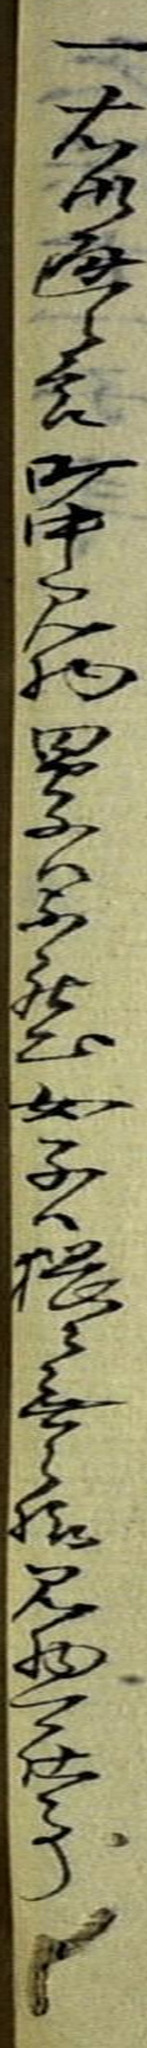一右御通之節町中見物男子は不罷出女子は猥に無之様見物可仕事
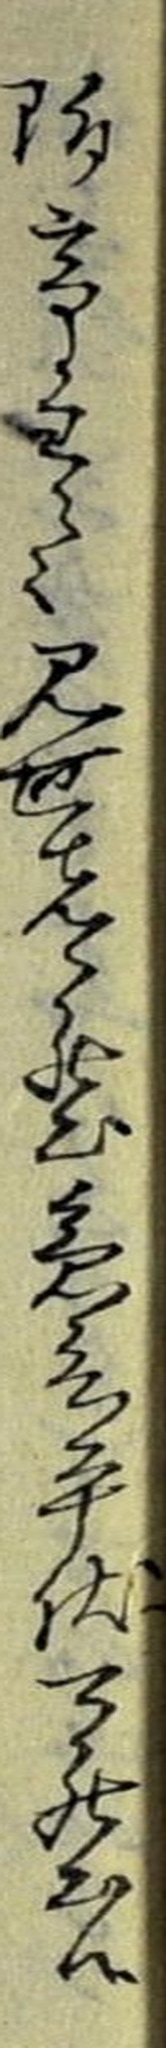附亭主々々見せ先へ罷出急度平伏可罷出候
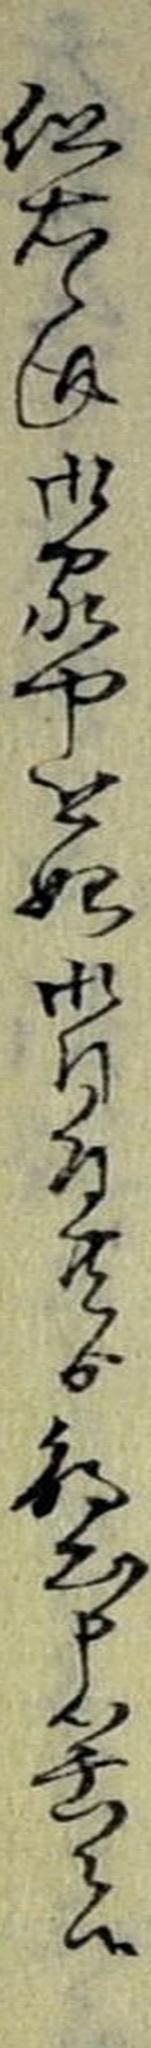但右之趣御家中を始御目付共ゟ触出申筈に候
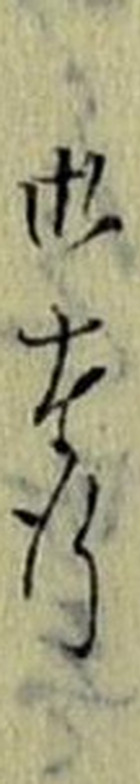御奉行
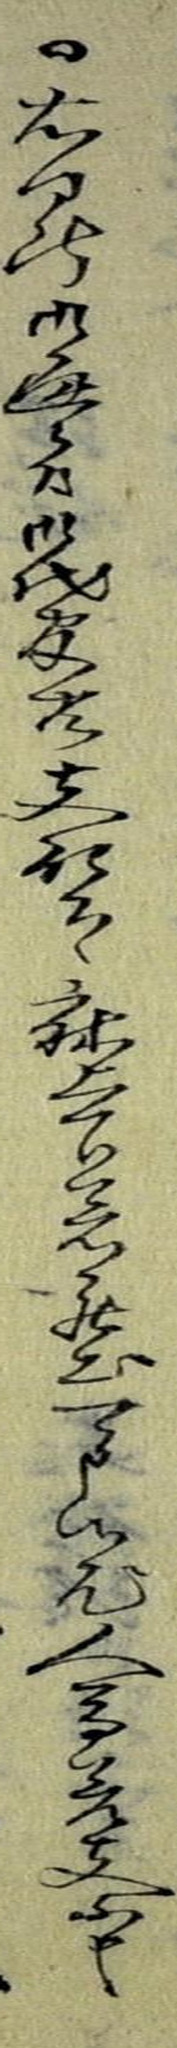○右同断御通に付御代官共支配下へ麻上下着罷出可申候尤人馬差支不申
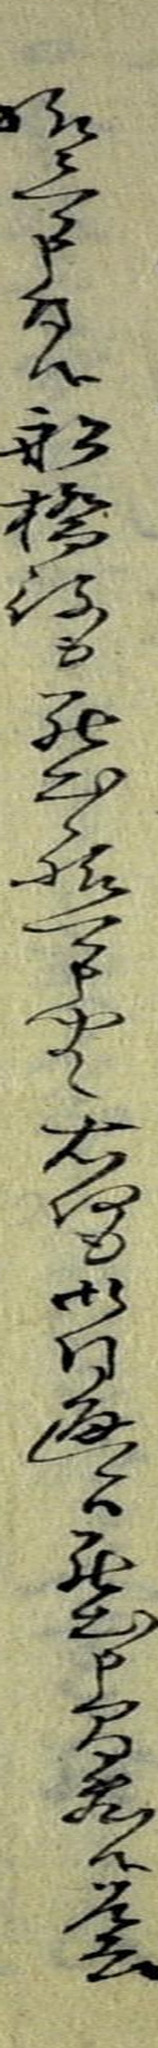様に可被申付候船橋役も罷出候様可申聞候右何も御目通は罷出申間敷候乍去
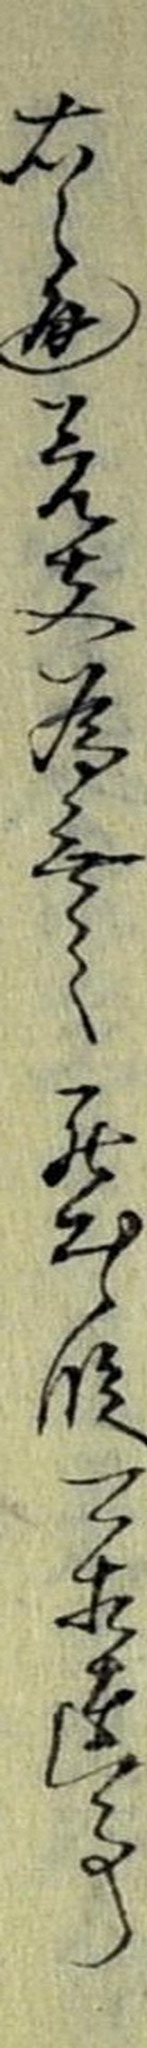右之通差支為無之罷出候段可相達事
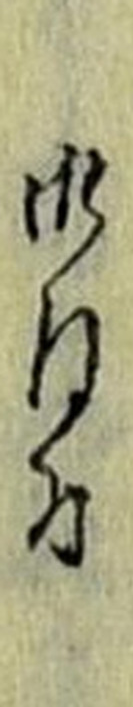御目付
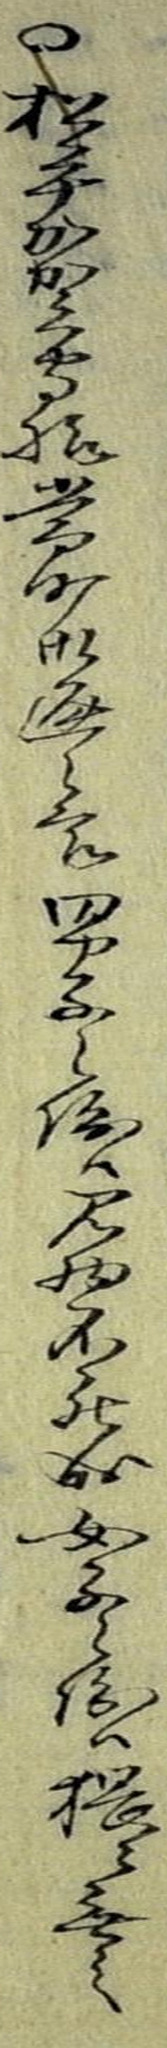○松平加賀守様当町御通之節男子之儀は見物不罷出女子之儀は猥に無之
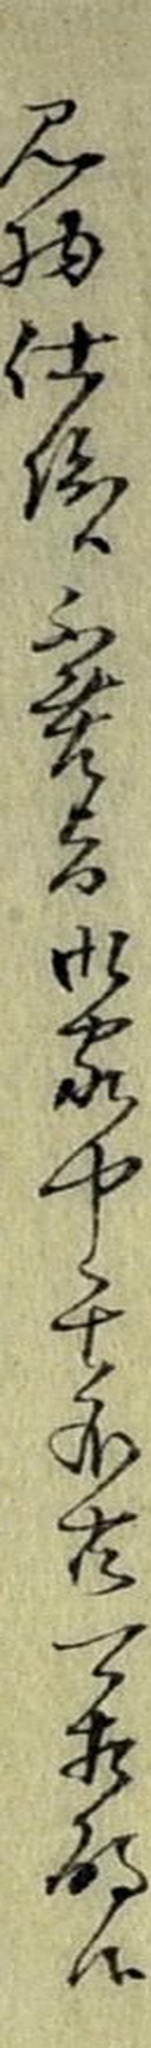見物仕儀は不苦旨御家中其外共可相触候
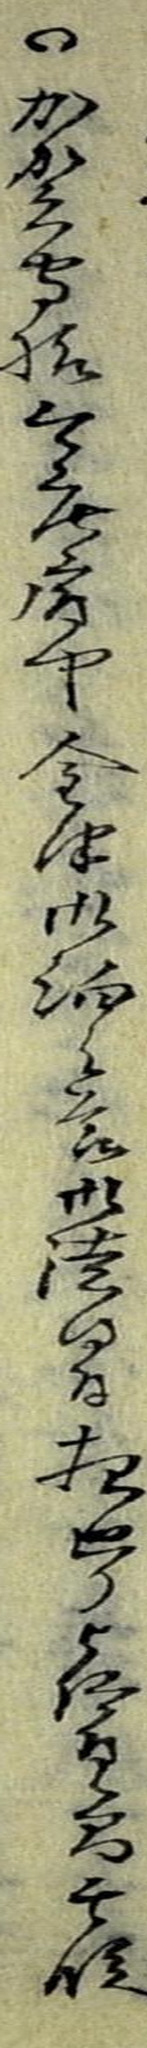○加賀守様今度府中金津御泊之節御徒目付夜廻り被仰付候間其段
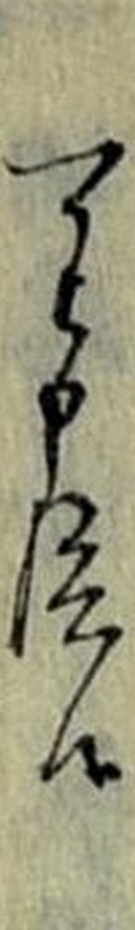可被申渡候
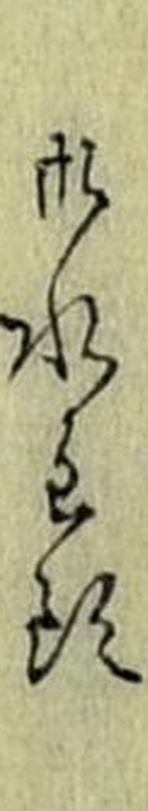御水主頭
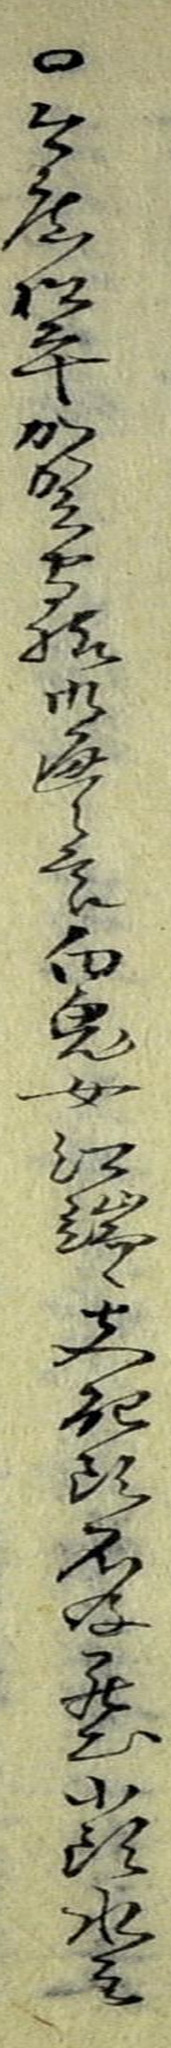○今度松平加賀守様御通之節白鬼女江端へ支配頭不及罷出小頭水主
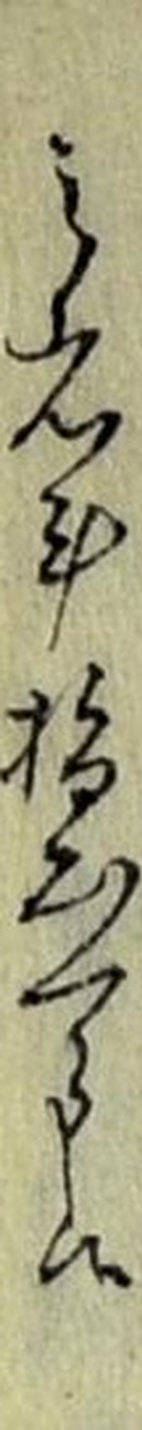之者斗指出可申事
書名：命令之部 六
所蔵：福井県文書館 Fukui Prefectural Archives
